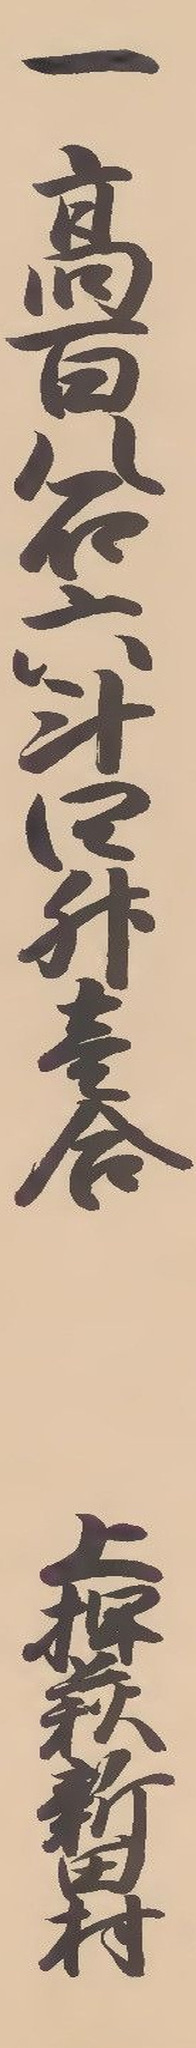一高百八石六斗四升壱合上押萩新田村

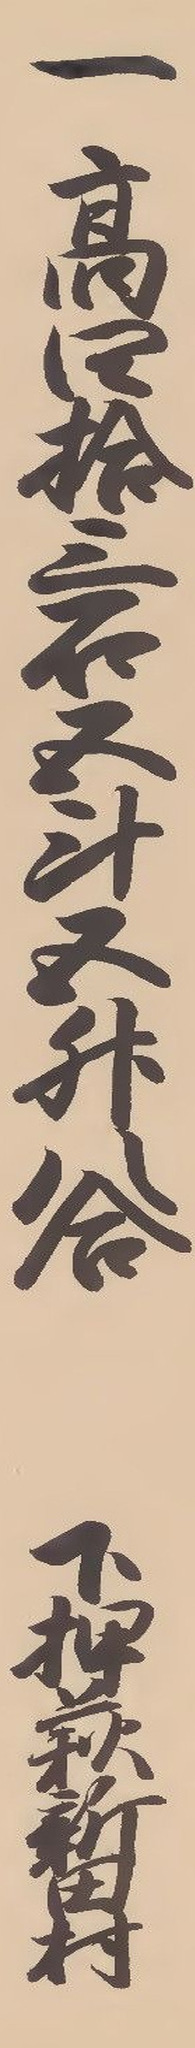一高四拾三石五斗五升八合下押萩新田村
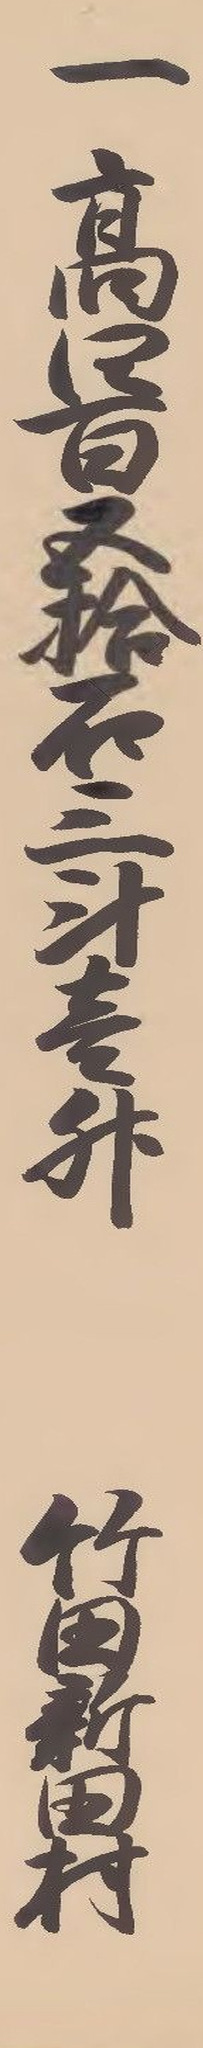一高四百五拾石三斗壱升竹田新田村
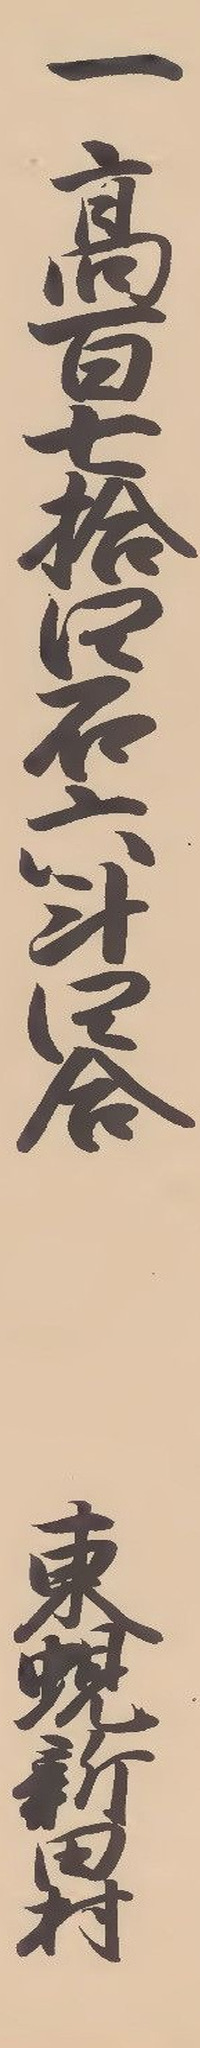一高百七拾四石六斗四合東蜆新田村
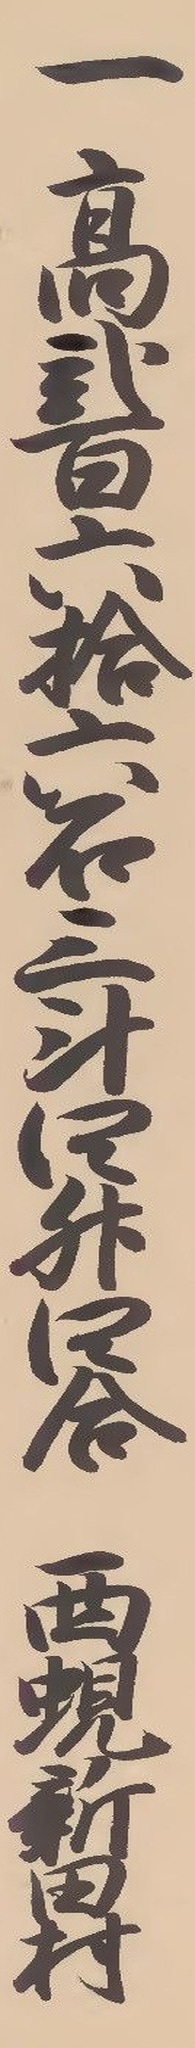一高弐百六拾六石三斗四升四合西蜆新田村
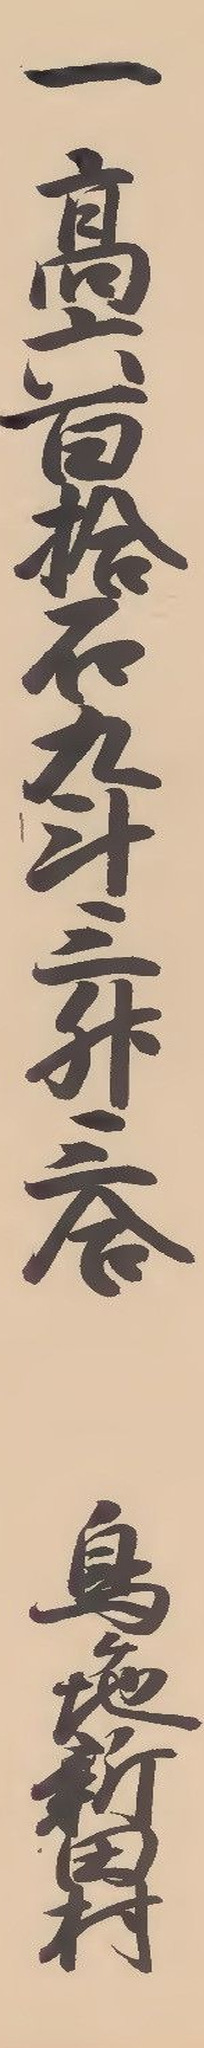一高六百拾石九斗三升三合鳥ヶ地新田村
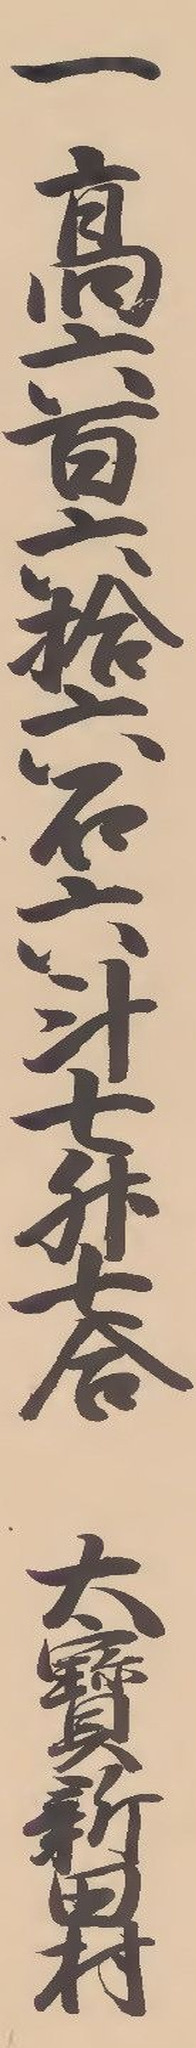一高六百六拾六石六斗七升七合大宝新田村

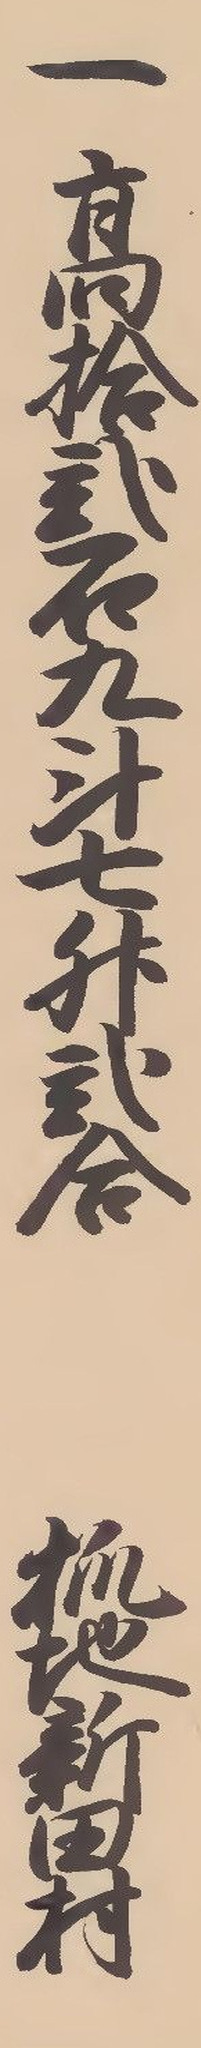一高拾弐石九斗七升弐合狐地新田村
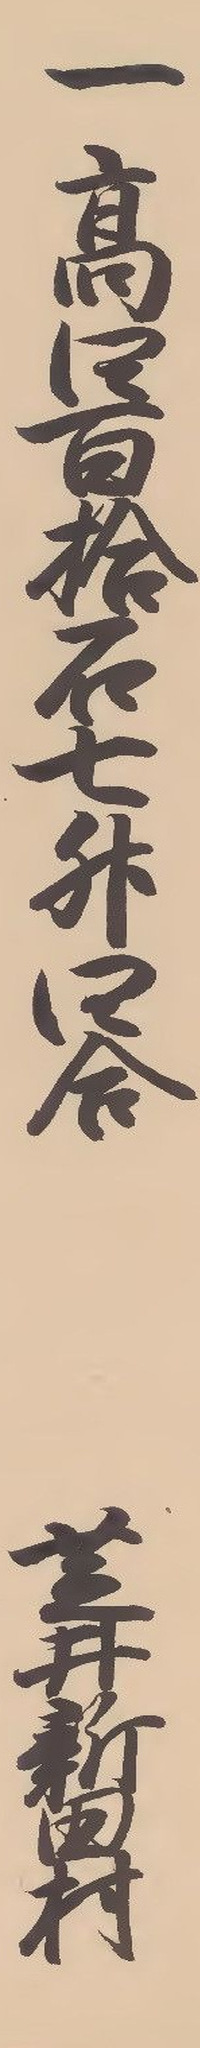一高四百拾石七升四合芝井新田村
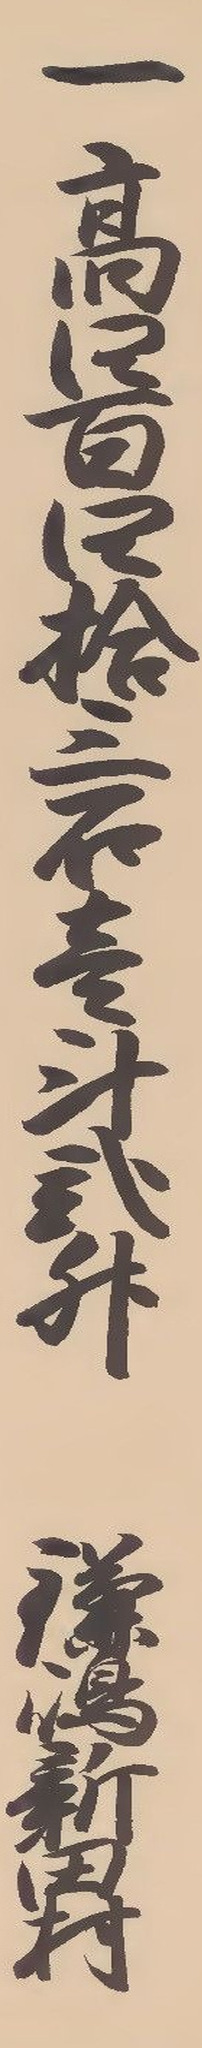一高四百四拾三石壱斗弐升鎌島新田村
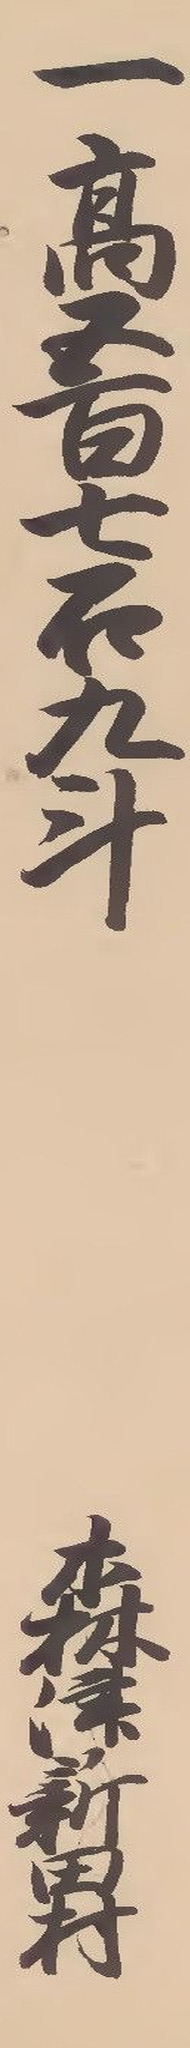一高五百七石九斗森津新田村
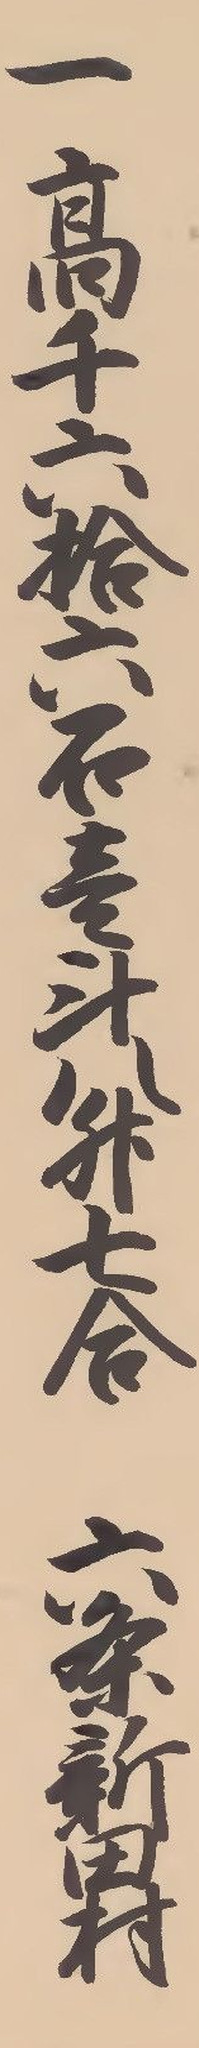一高千六拾六石壱斗八升七合六条新田村
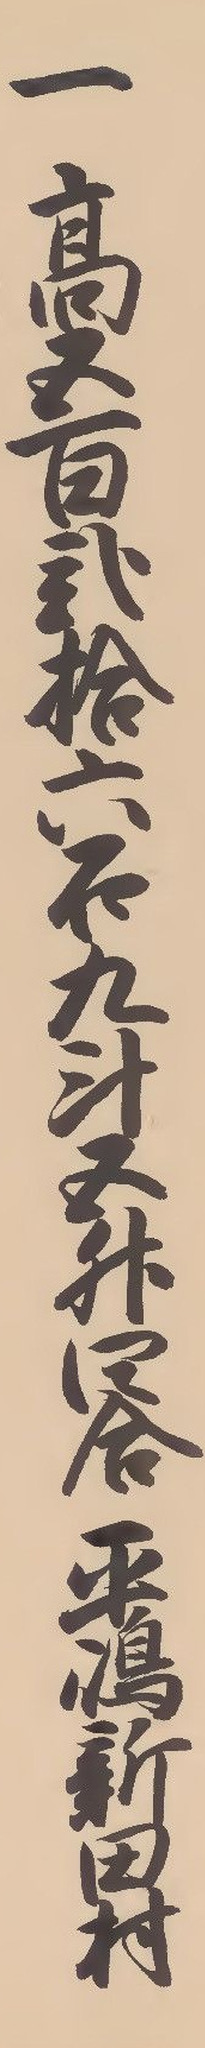一高五百弐拾六石九斗五升四合平島新田村
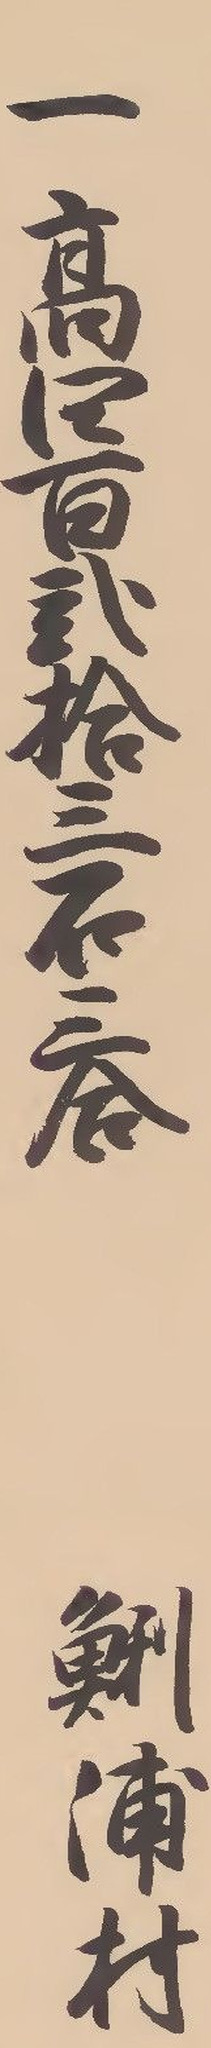一高四百弐拾三石三合鯏浦村

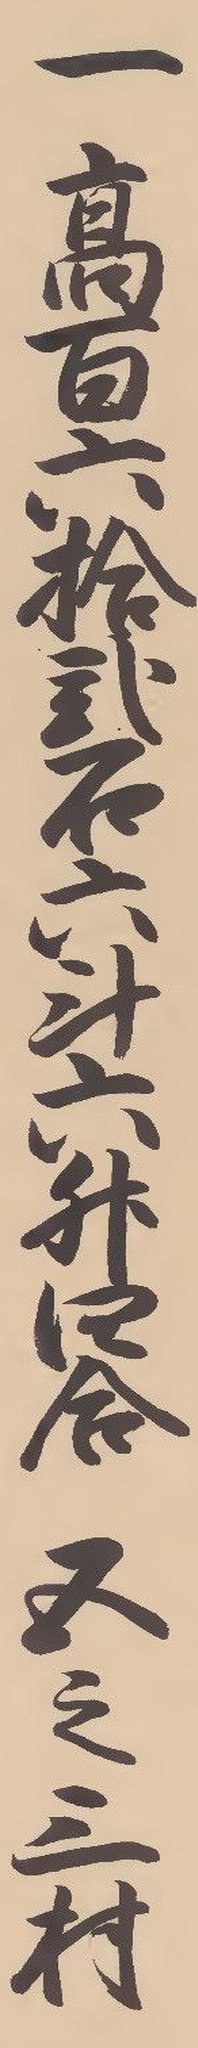一高百六拾弐石六斗六升四合五之三村
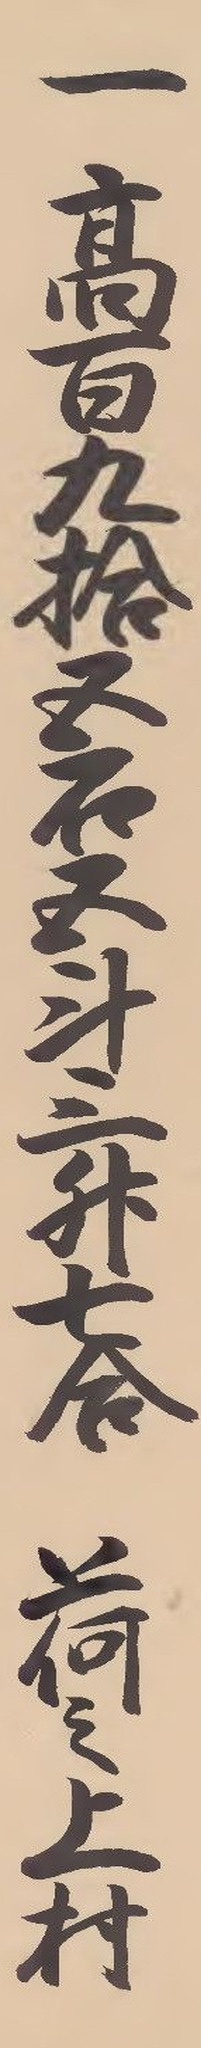一高百九拾五石五斗三升七合荷之上村
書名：尾張国郷帳
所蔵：国立公文書館 National Archives of Japan
